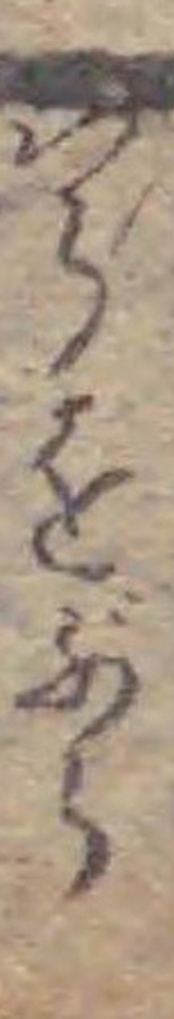はらをぶら
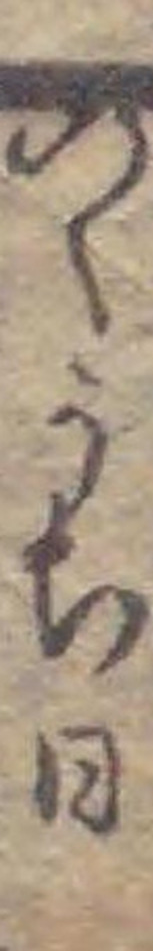つくうち日
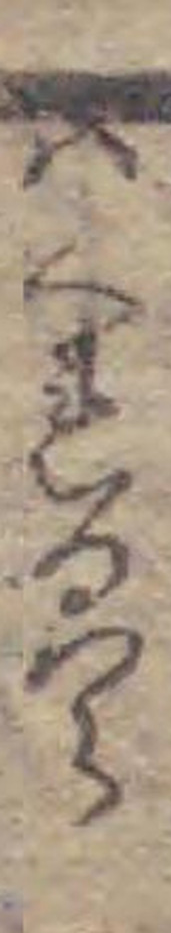はくれるはら
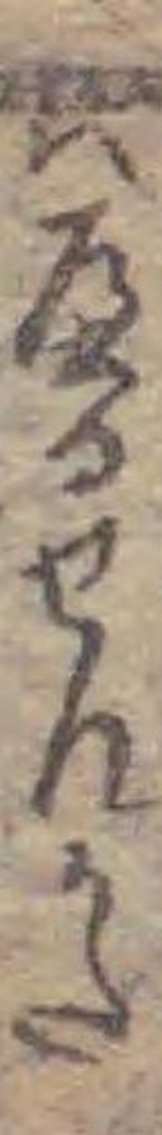はへるせんかた
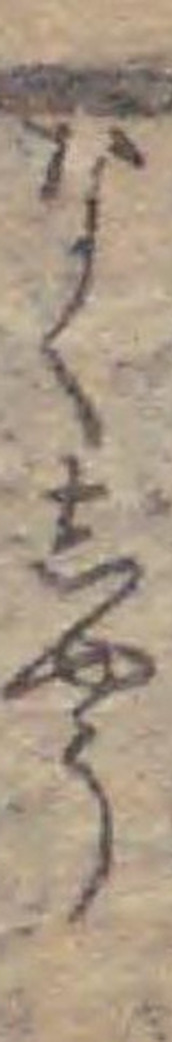なくしやう
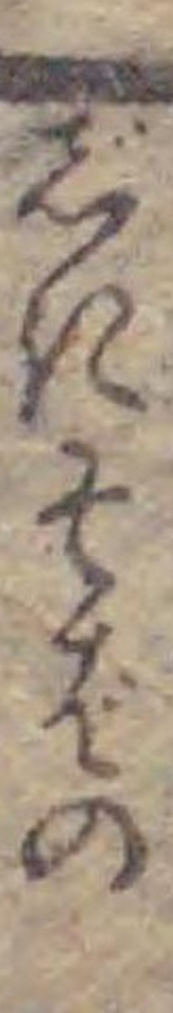じきそばの
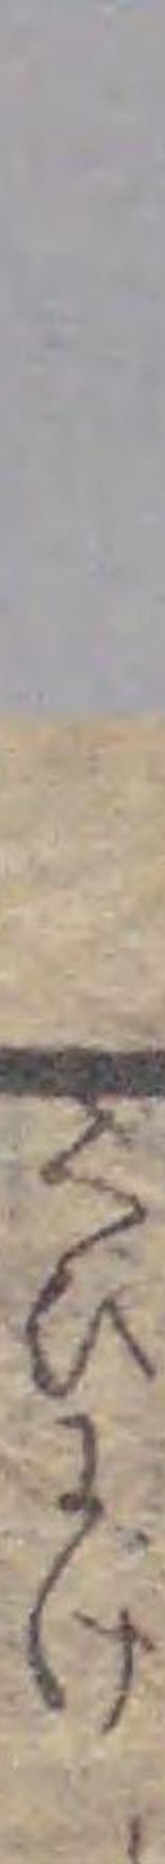くひにけ
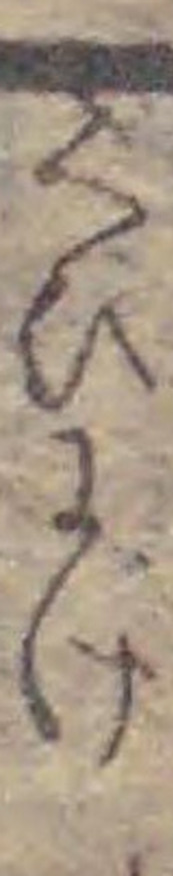くひにけ
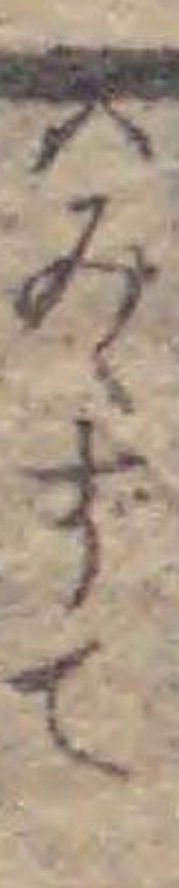はみゝずて
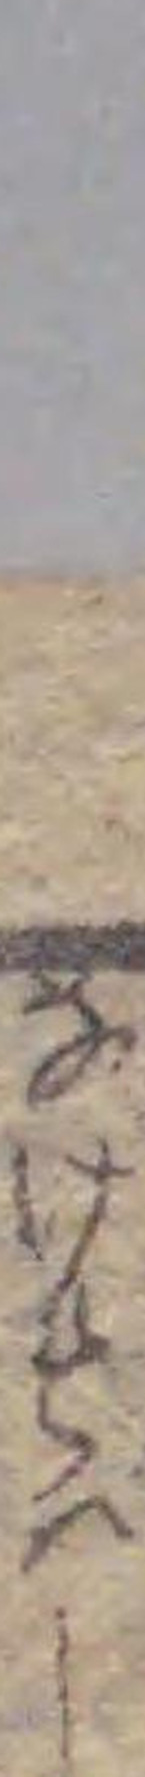なければ
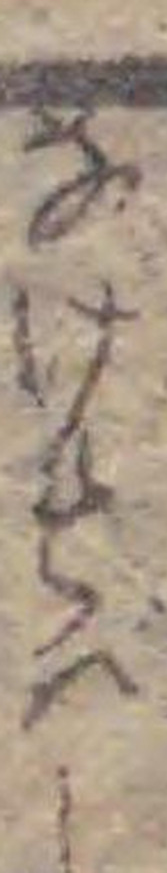なければ

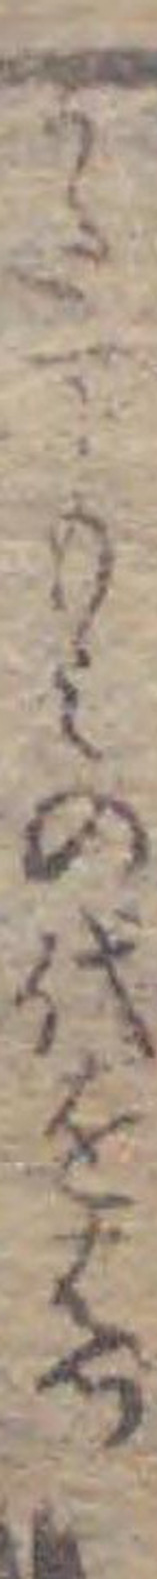かた下もみの代をはづ
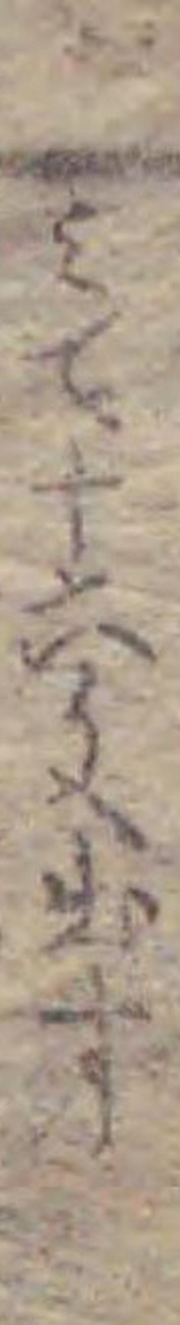みて十六文出す
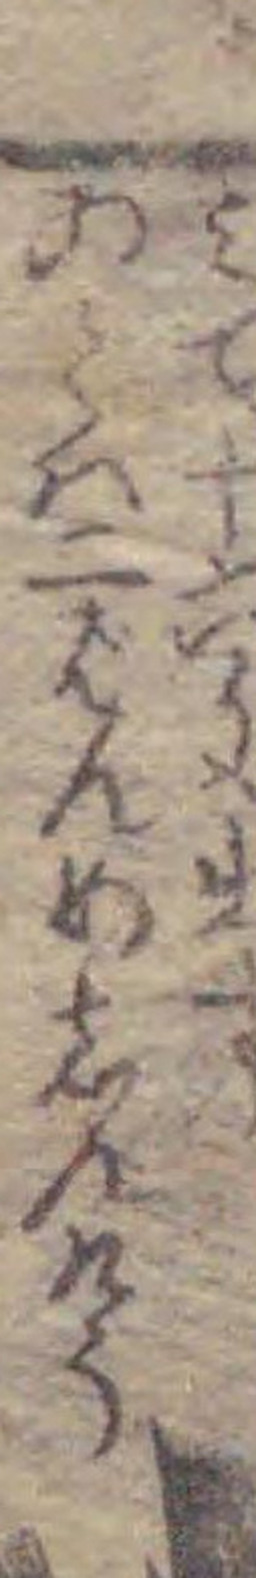あとは二ばんめしんけう
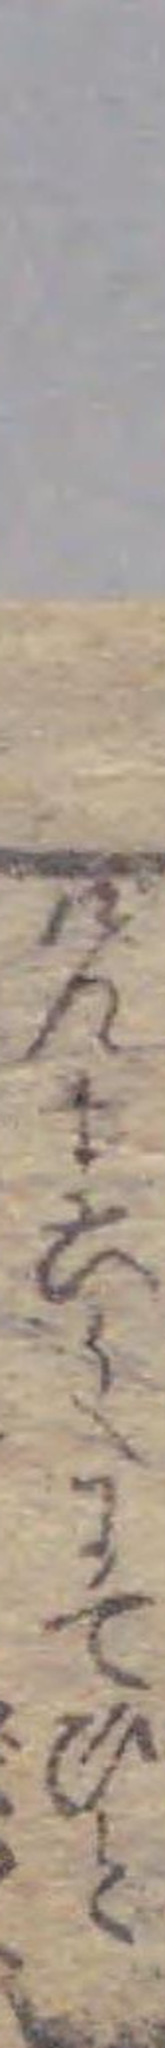けん十六文にてひと
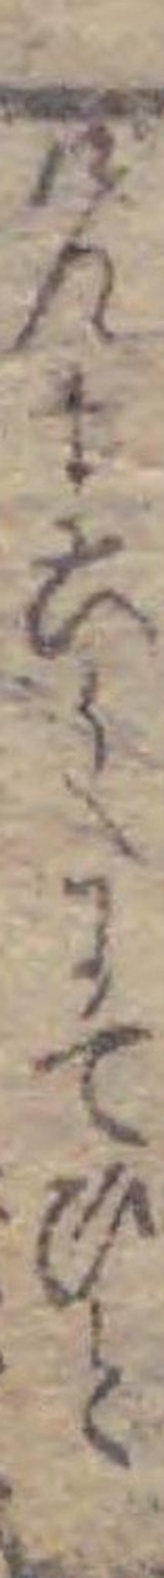けん十六文にてひと
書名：紺屋百物語 : 3巻
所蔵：国立国会図書館 National Diet Library, JAPAN
